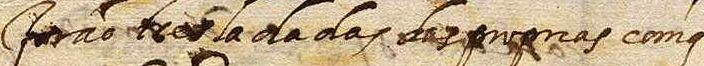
forão tresladadas das proprias com q̄
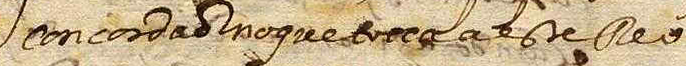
concordaõ no que tocca a este Reo
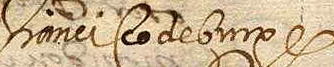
Francisco de burges
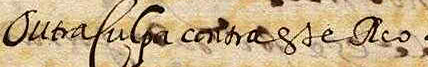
Outra Culpa contra este Reo.
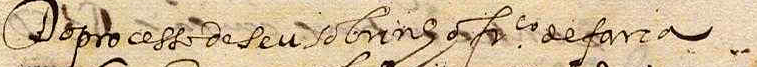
Do processo de seu sobrinho fr.co de faria
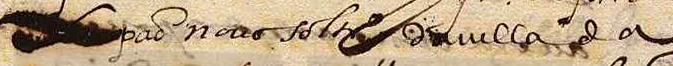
Xpão nouo soltro da uilla da
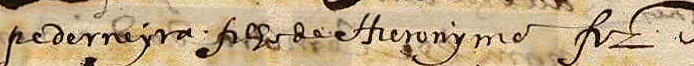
pederneyra filho de Hieronymo fr̄z
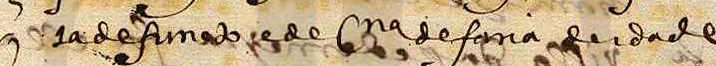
ia defuncto e de Cna de faria de idade
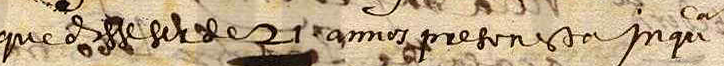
que disse ser de 21 annos preso nesta Jnquçā
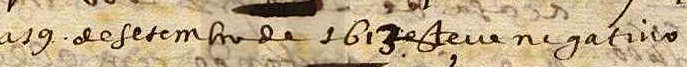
a 19 de setembro de 1613 esteue negatiuo
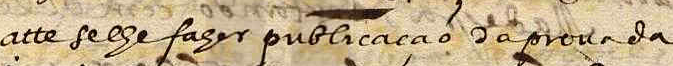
atte se lhe fazer publicaçaõ da proua da
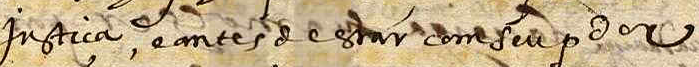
justiça, e antes de estar com seu pdor
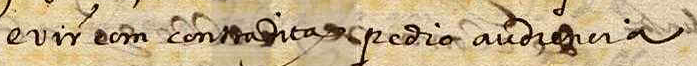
e vir com contraditas pedia audiencia
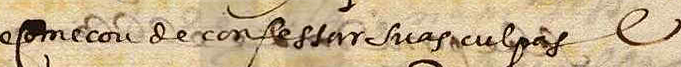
e Começou de confessar suas culpas e
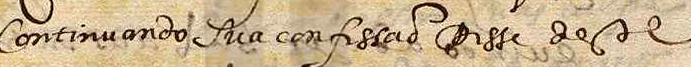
Continuando sua confissaõ Disse deste
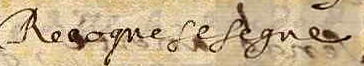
Reo o que se segue.
